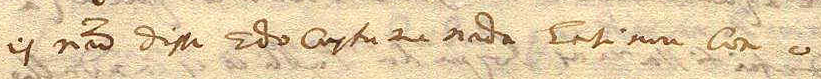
is não disse E do custume nada E asinou com o
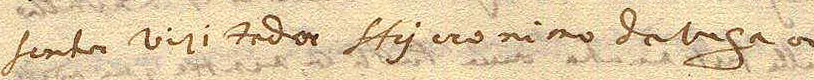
senhor Vizitador Hyeronimo da vega o es
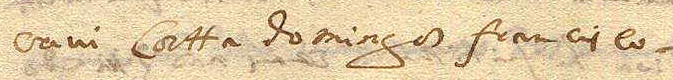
creui Costta domingos francisco
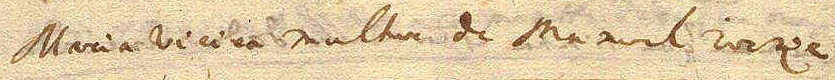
Maria Vieira mulher de Manoel iorze
